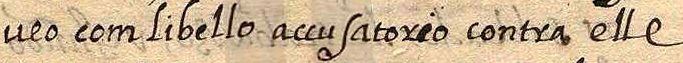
ueo com Libello accusatorio contra elle
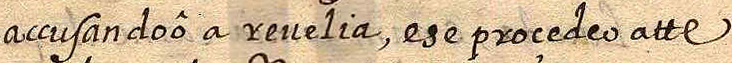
accusandoô a reuelia, e se procedeo atte
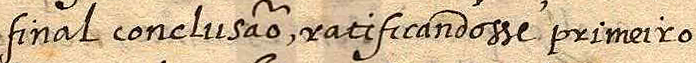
finaL conclusão, ratificandosse primeiro
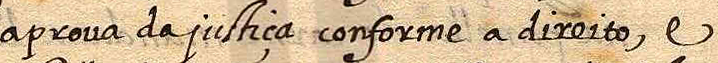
a proua da justiça conforme a direito, e
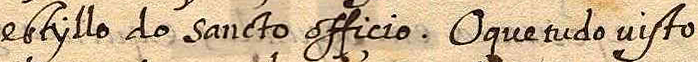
estyllo do sancto officio. O que tudo uisto
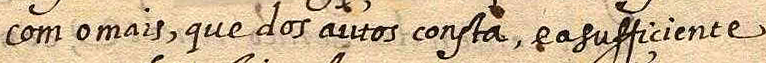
com o mais, que dos autos consta, e a sufficiente
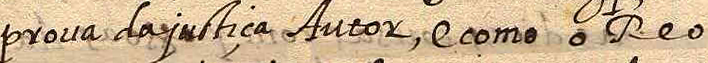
proua da justiça Autor, e como o Reo
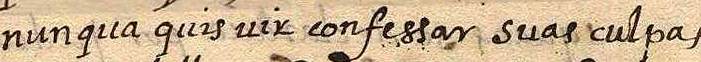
nunqua quis uir confessar suas culpas
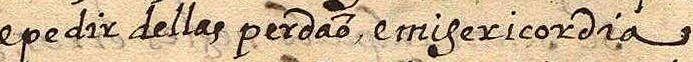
e pedir dellas perdão, e misericordia
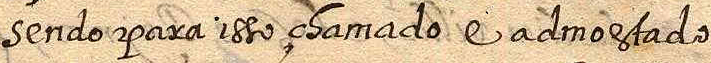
sendo para isso chamado e admoestado
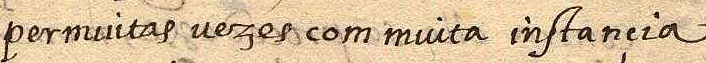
per muitas uezes com muita instancia
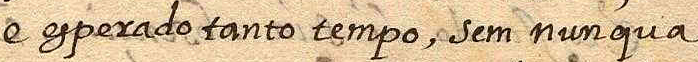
e esperado tanto tempo, sem nunqua
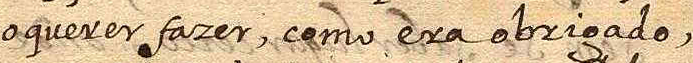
o querer fazer, como era obrigado,
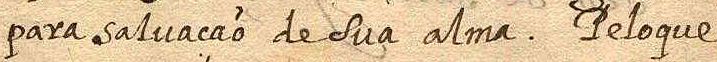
para saluação de sua alma. Pelo que
